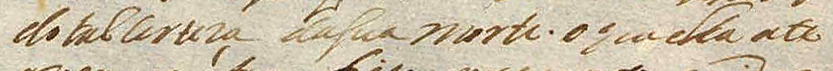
de tal certeza da sua morte. o que ella ate
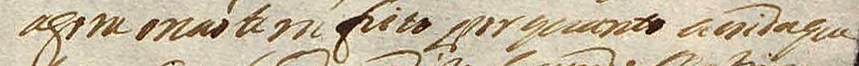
agora o naõ tem feito por quanto ainda que
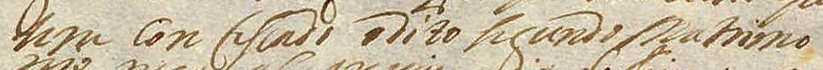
tem confessado o dito segundo matrimo
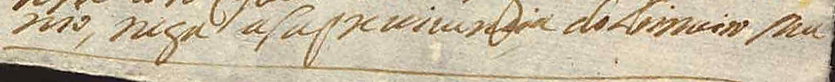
nio, nega a supreuiuencia do Primeiro Ma
